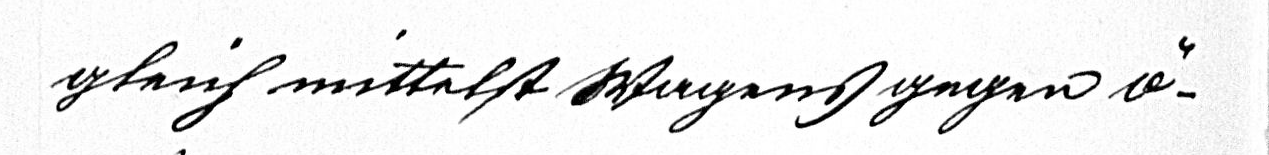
gleich mittelst Wagens gegen ö¬
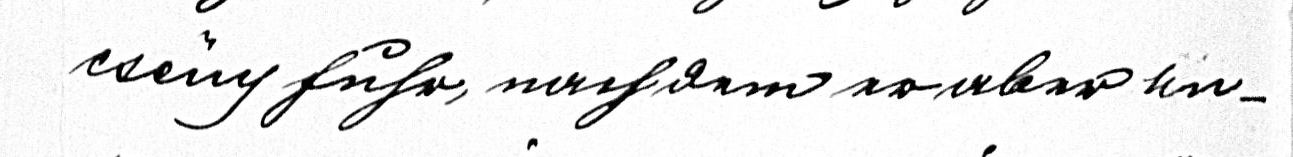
csényfuhr, nach dem er aber un¬
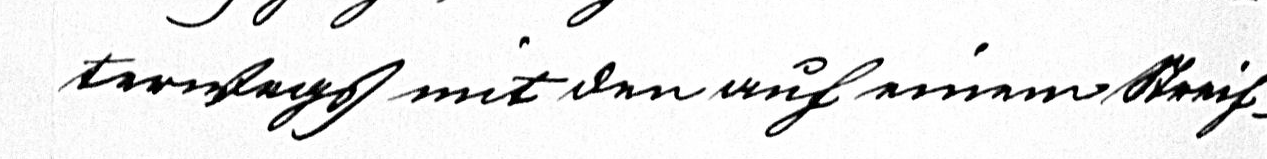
terwegs mit den auf einem Streif¬
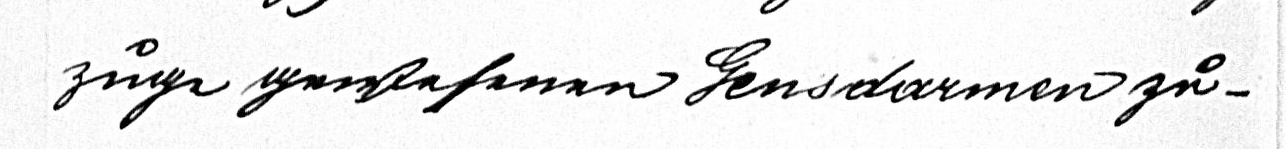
zuge gewesenen Gendarmen zu¬
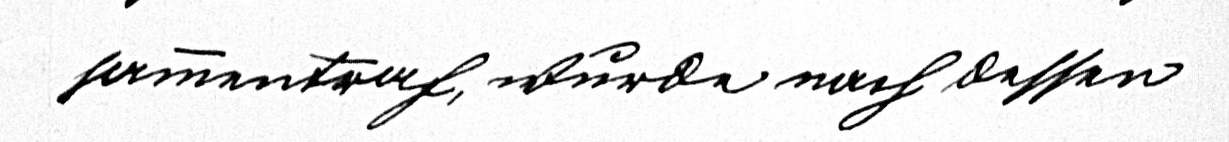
sammentraf, wurde nach dessen
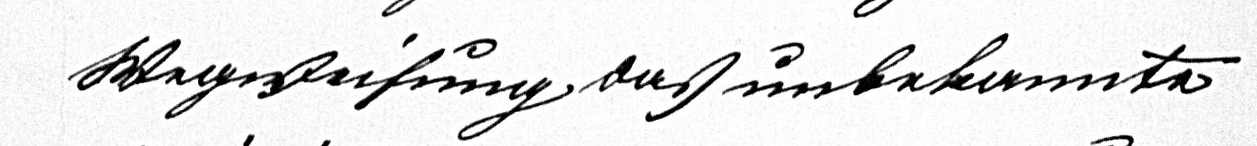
Wegweisung das unbekannte
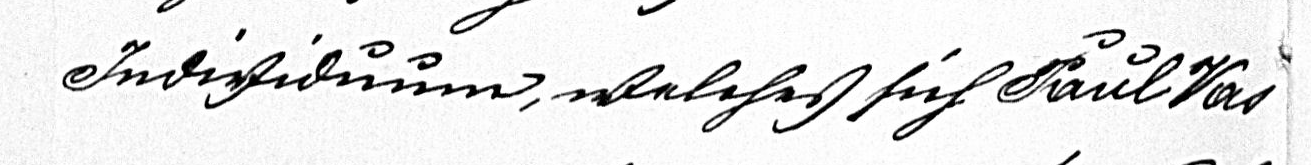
Individuum, welches sich Paul Vas¬
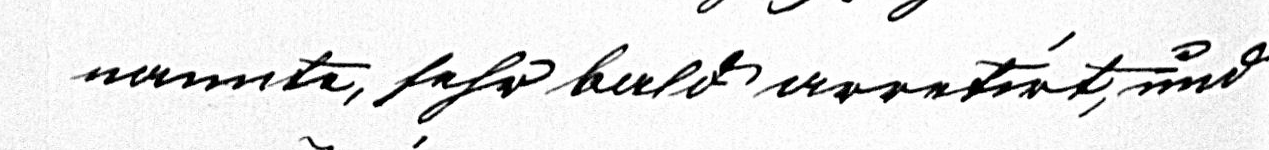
nannte, sehr bald arretirt, und
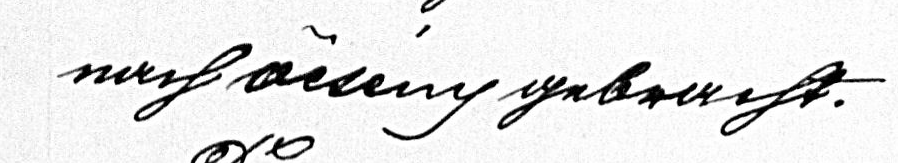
nach öcsény gebracht.
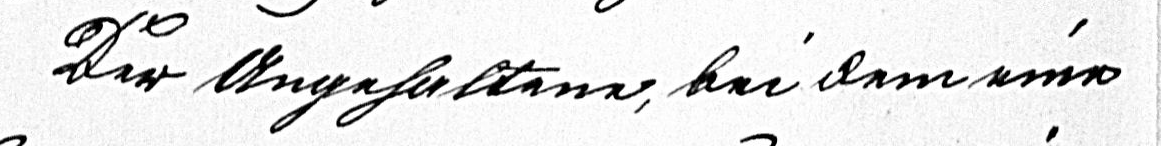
Der Angehaltene, bei dem eine
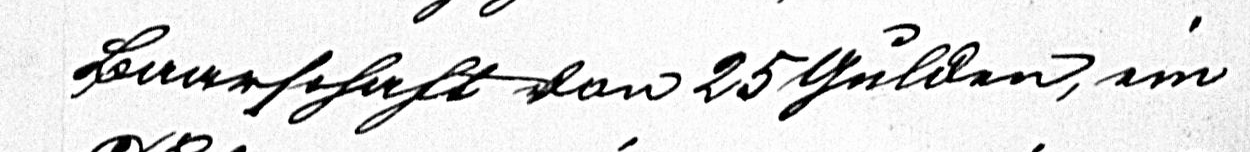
Baarschaft von 25 Gulden, ein
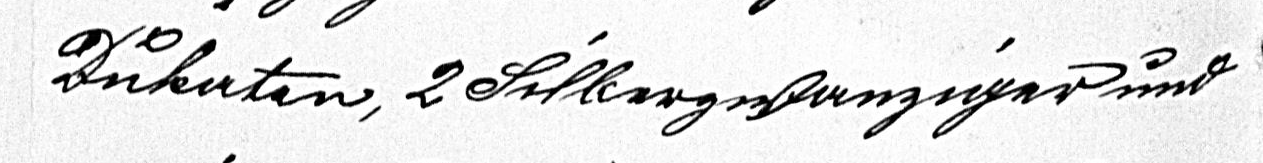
Dukaten, 2 Silbergwanziger und
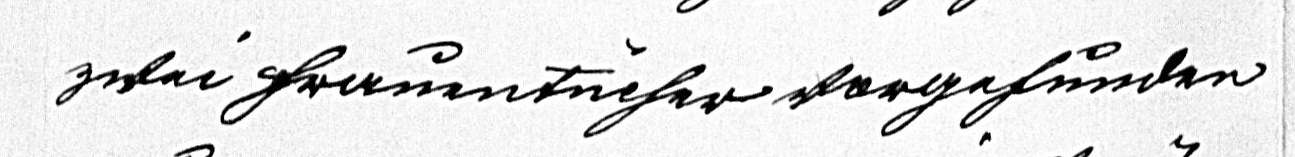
zwei Frauentücher vorgefunden
